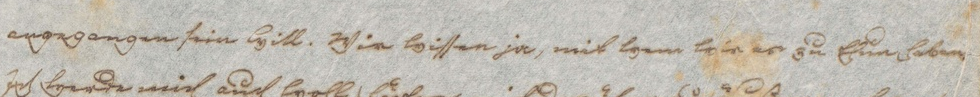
angegangen sein will. Wir wissen ja, mit wem wir es zu thun haben.
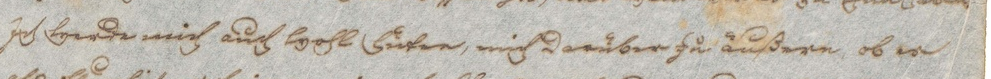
Ich werde mich auch wohl hüten, mich darüber zu äußern, ob es
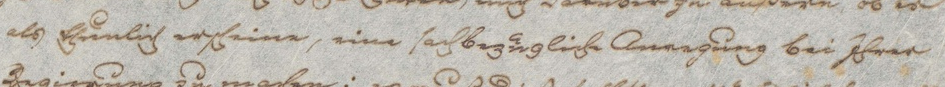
als thunlich erscheine, eine sachbezügliche Anregung bei Ihrer
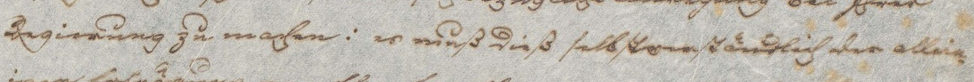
Regierung zu machen: es muß dieß selbstverständlich der allein-
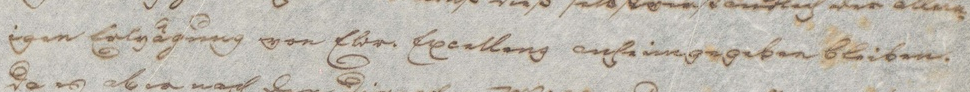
igen Erwägung von Ewr. Excellenz anheimgegeben bleiben.
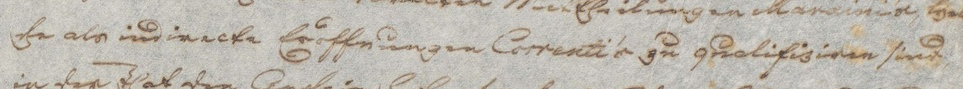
che als indirecte Eröffnungen Correnti's zu qualifiziren sind,
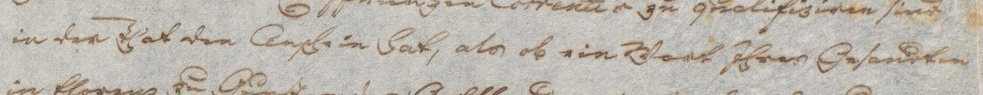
in der That den Anschein hat, als ob ein Wort Ihres Gesandten
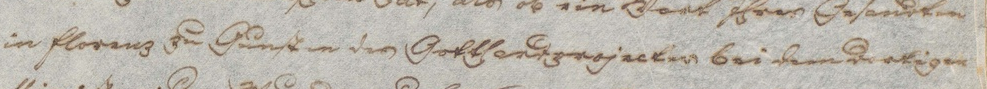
in Florenz zu Gunsten des Gotthardprojectes bei dem dortigen
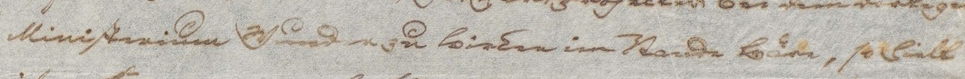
Ministerium Wunder zu wirken im Stande wäre, so hielt
